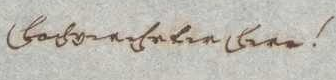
Hochverehrter Herr!
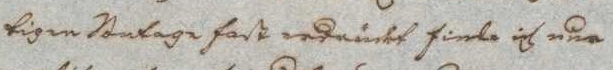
tigen Sontage fast erdrückt finde ich nur
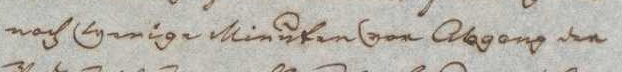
noch wenige Minuten vor Abgang der
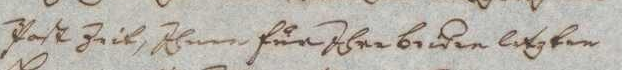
Post Zeit, Ihnen für Ihre beiden letzten
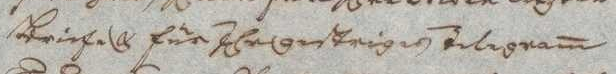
Briefe & für Ihr gestriges Telegramm
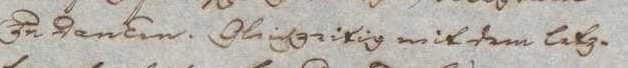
zu danken. Gleichzeitig mit dem letz-
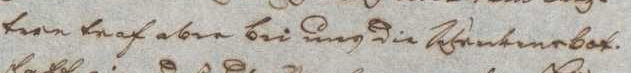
tern traf aber bei uns die Schreckensbot-
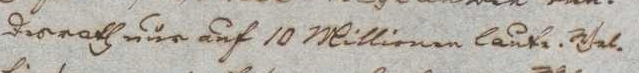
desrath nur auf 10 Millionen laute. Wel-
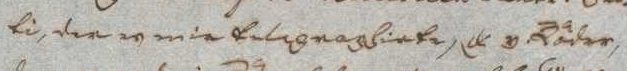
ti, der es mir telegraphirte, & v. Röder,
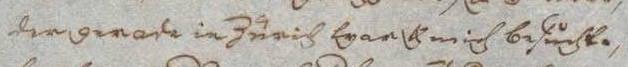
der gerade in Zürich war & mich besuchte,
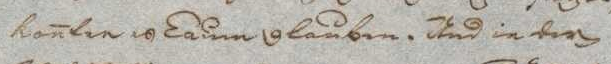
konnten es kaum glauben. Und in der
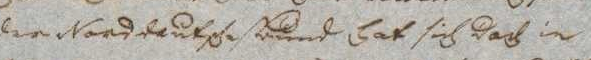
Der Norddeutsche Bund hat sich doch in
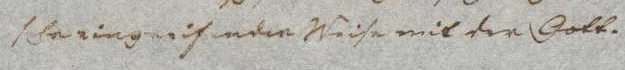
sehr eingreifender Weise mit der Gott-
